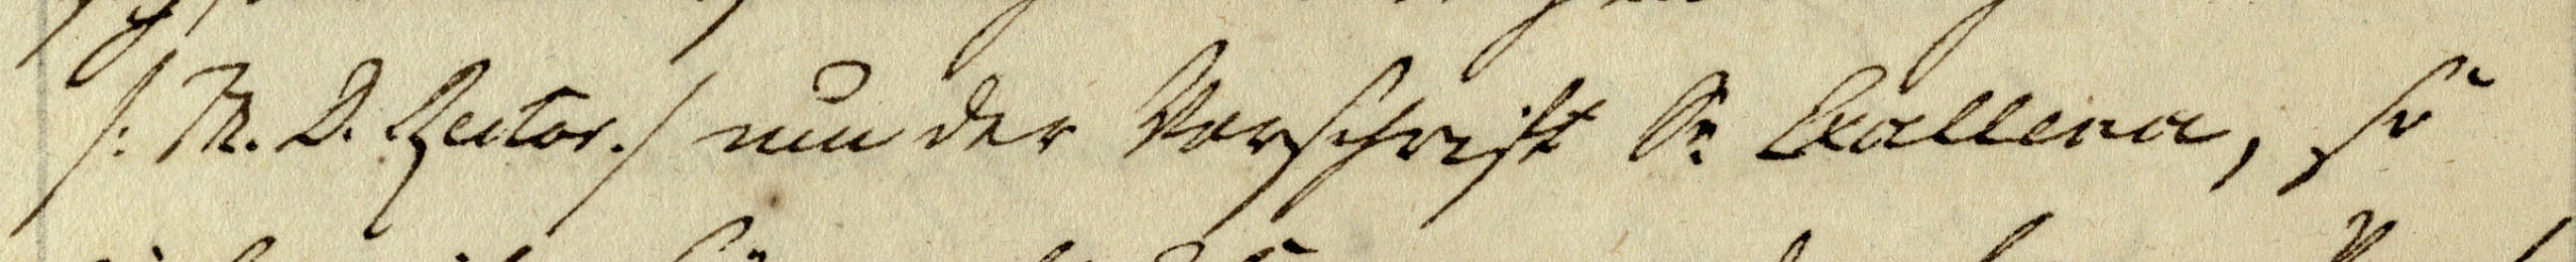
/. M. D. Rector ./ um der Vorschrift Sr Excellence, so
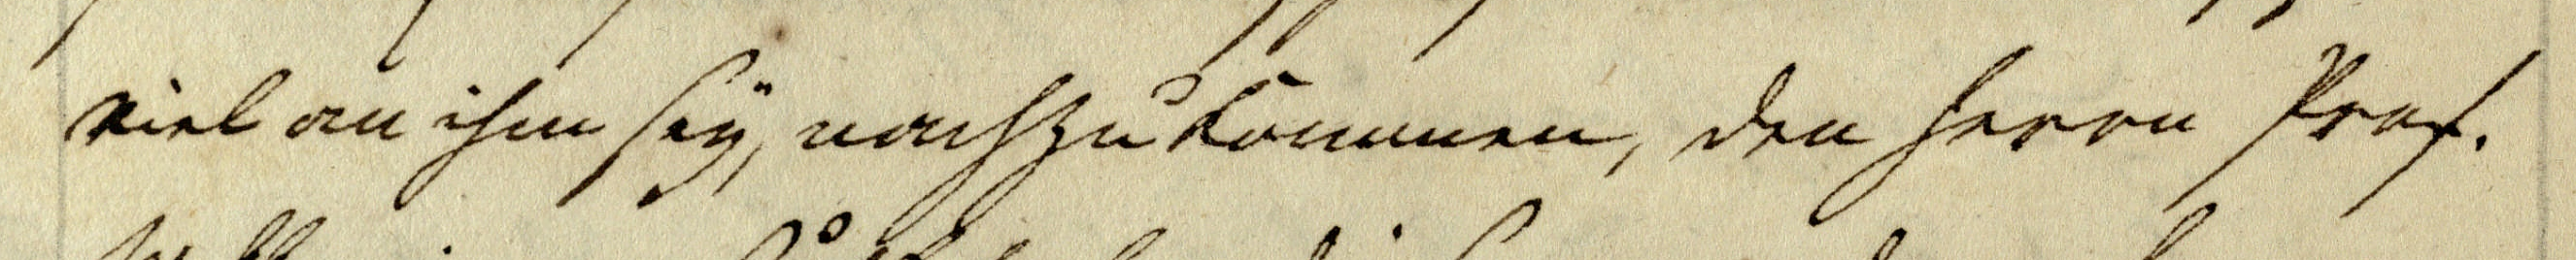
viel an ihm seÿ, nachzukommen, den Herrn Prof.
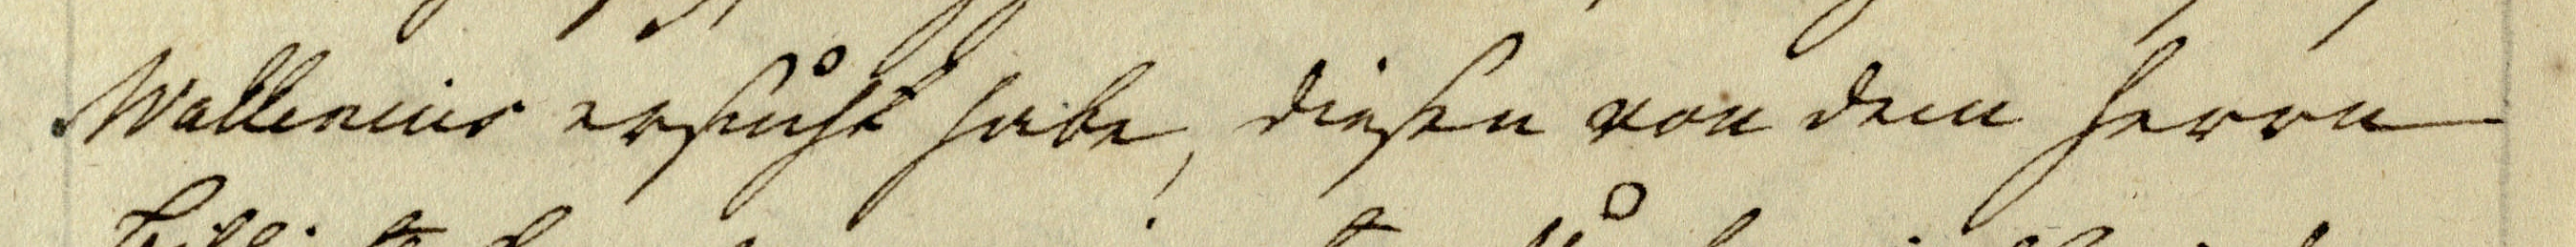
Wallenius ersucht habe, diesen von dem Herrn
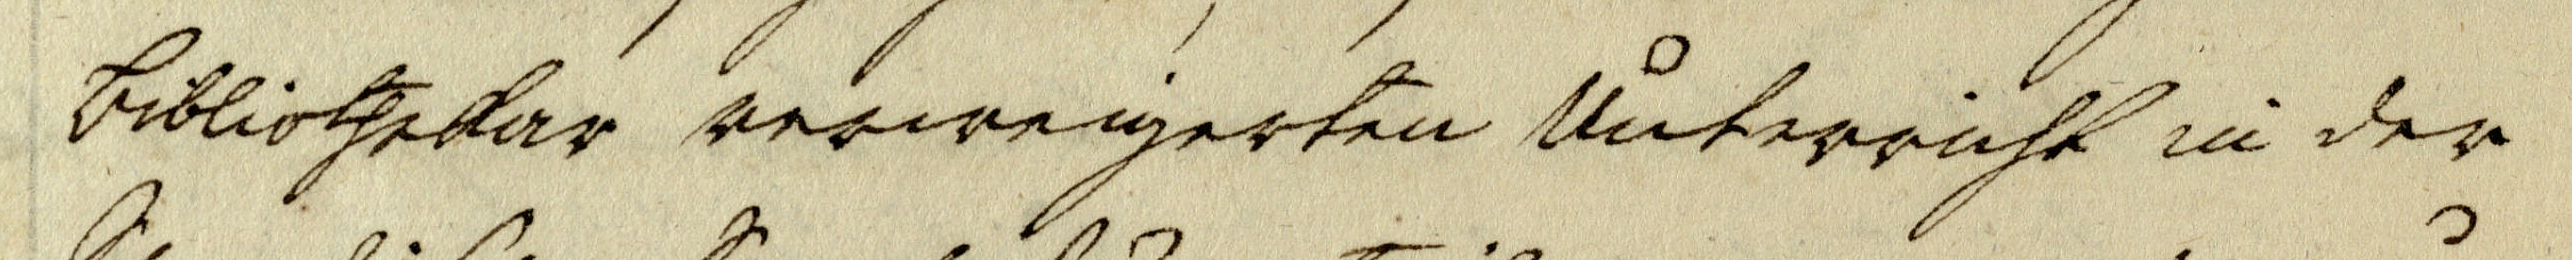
Bibliothekar verweigerten Unterricht in der
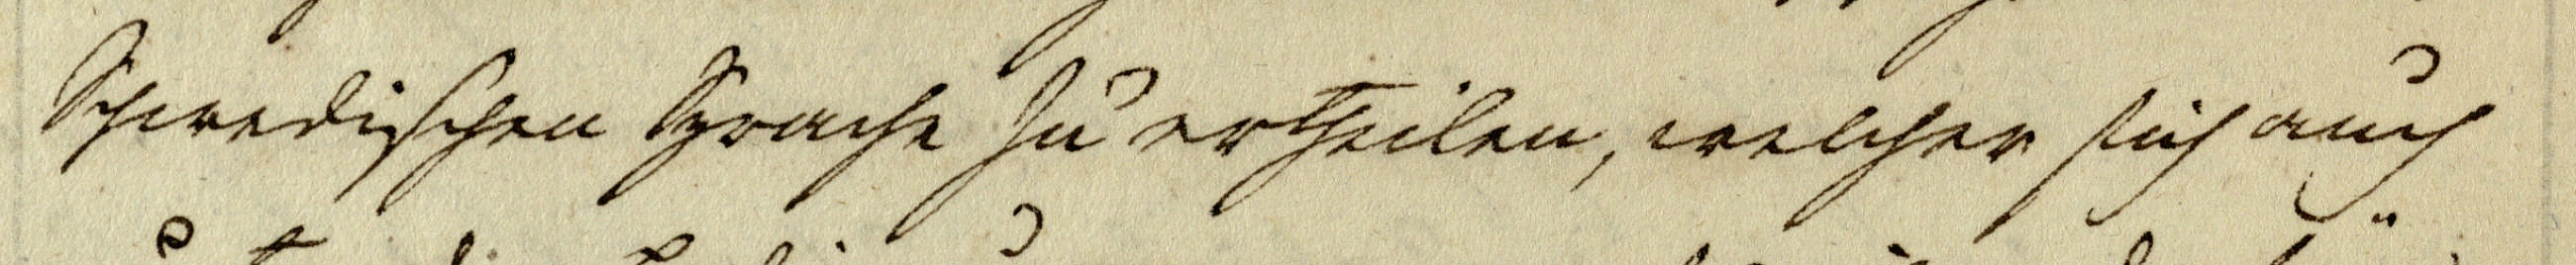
Schwedischen Sprache zu ertheilen, welcher sich auch
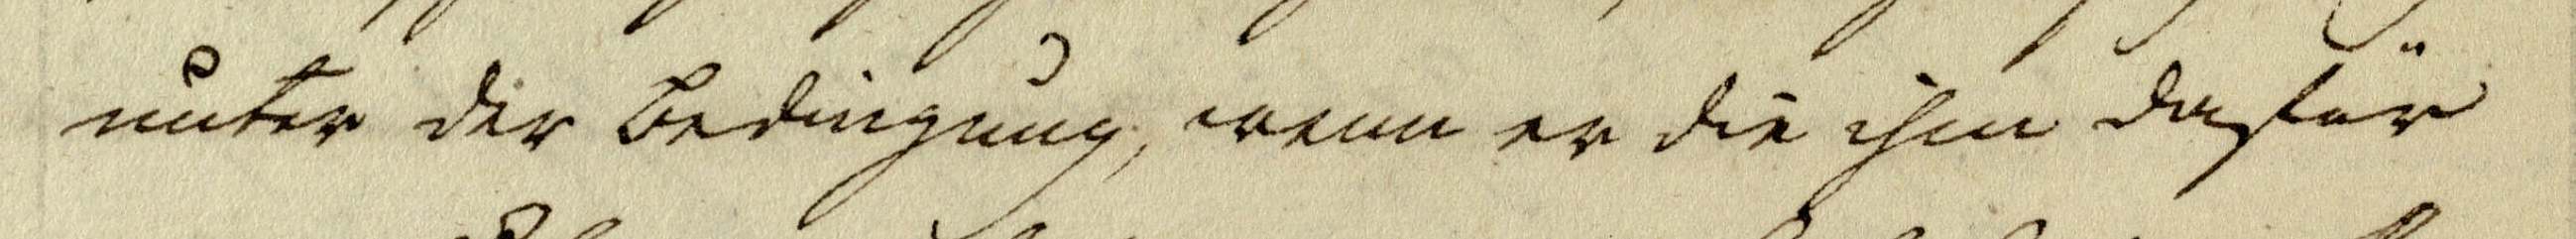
unter der Bedingung, wenn er die ihm dafür
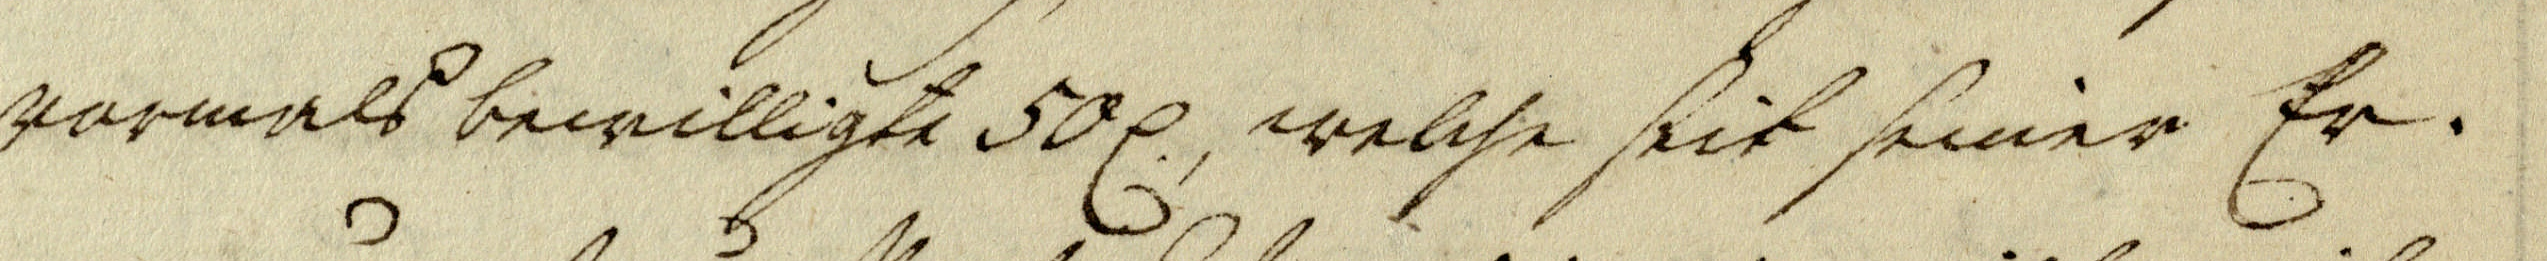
vormals bewilligte 50 l., welche seit seiner Er¬
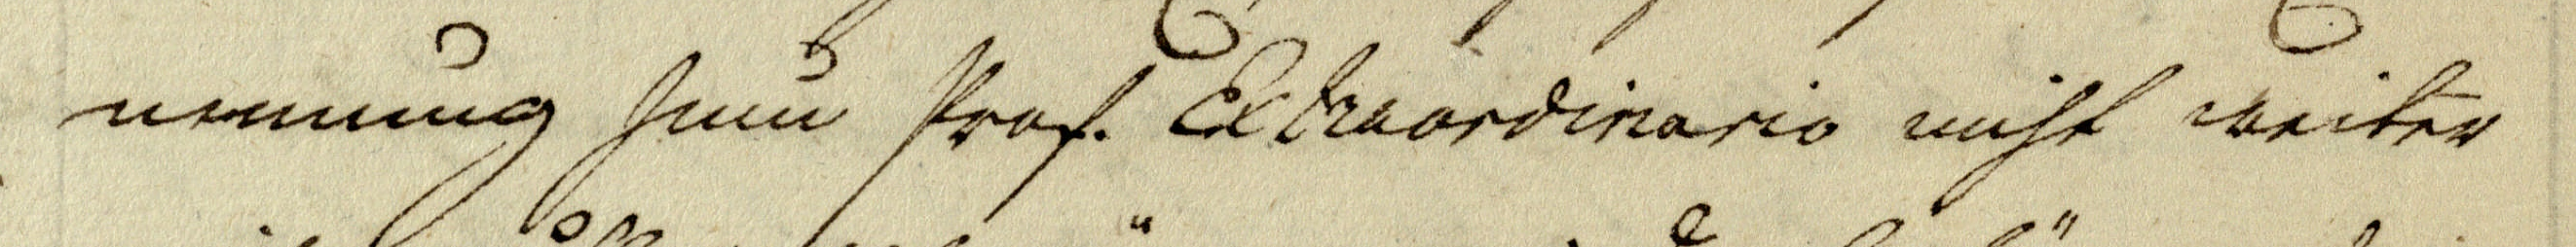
nennung zum Prof. Extraordinario nicht weiter
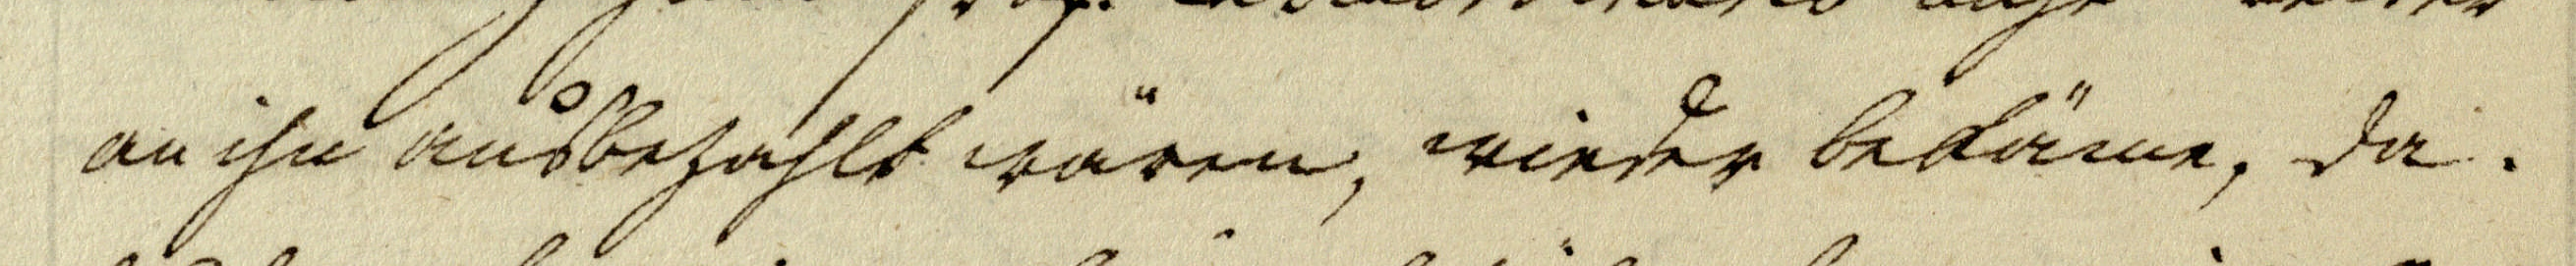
an ihn ausbezahlt wären, wieder bekäme, da¬
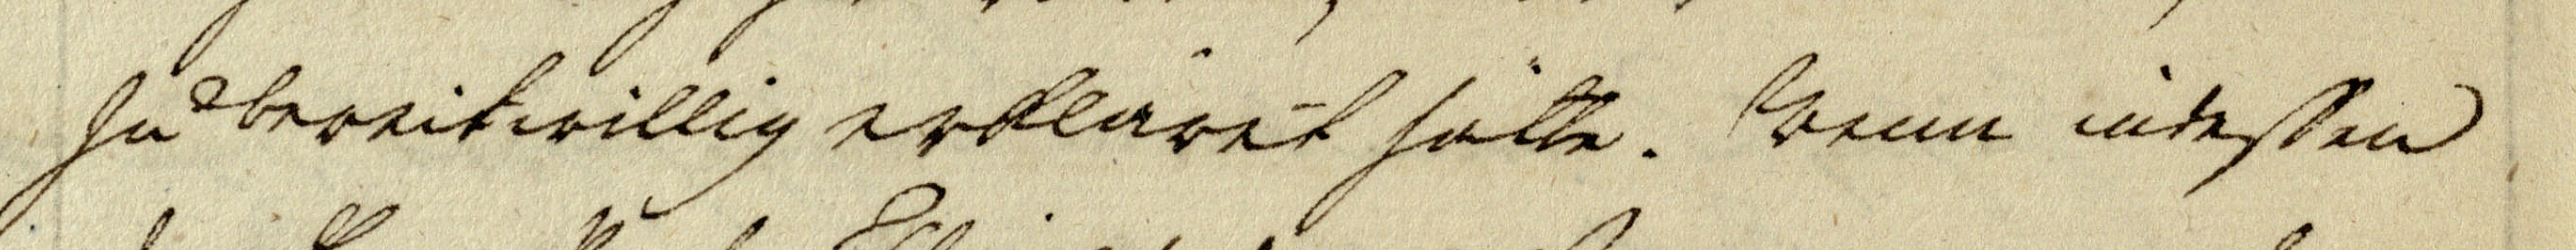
zu bereitwillig erkläret hätte. Wenn indessen
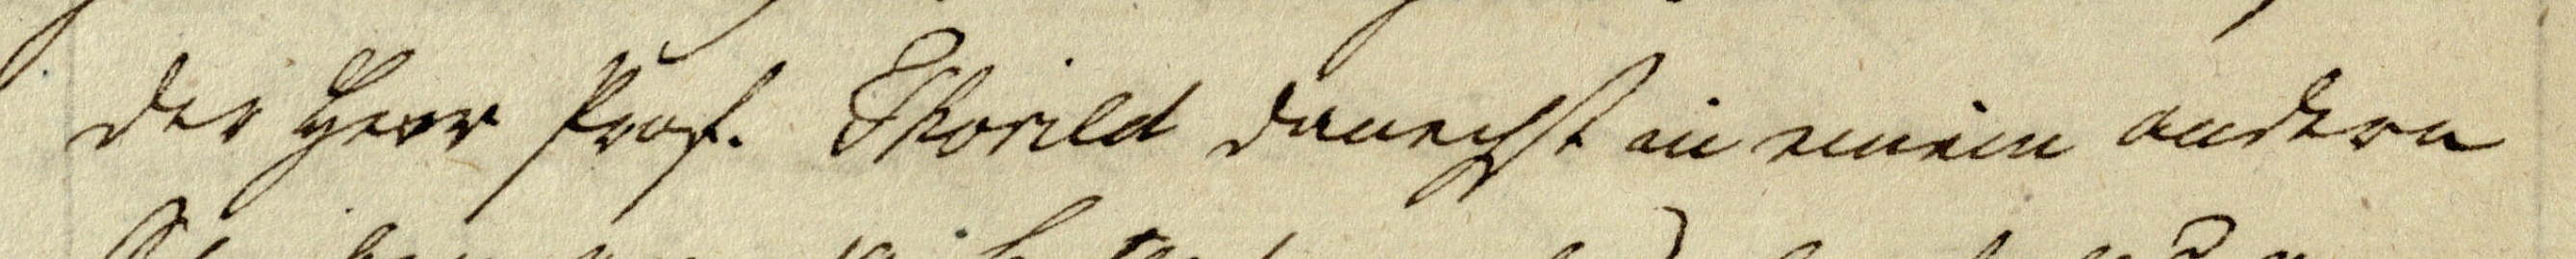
der Herr Prof. Thorild danechst in einem andern
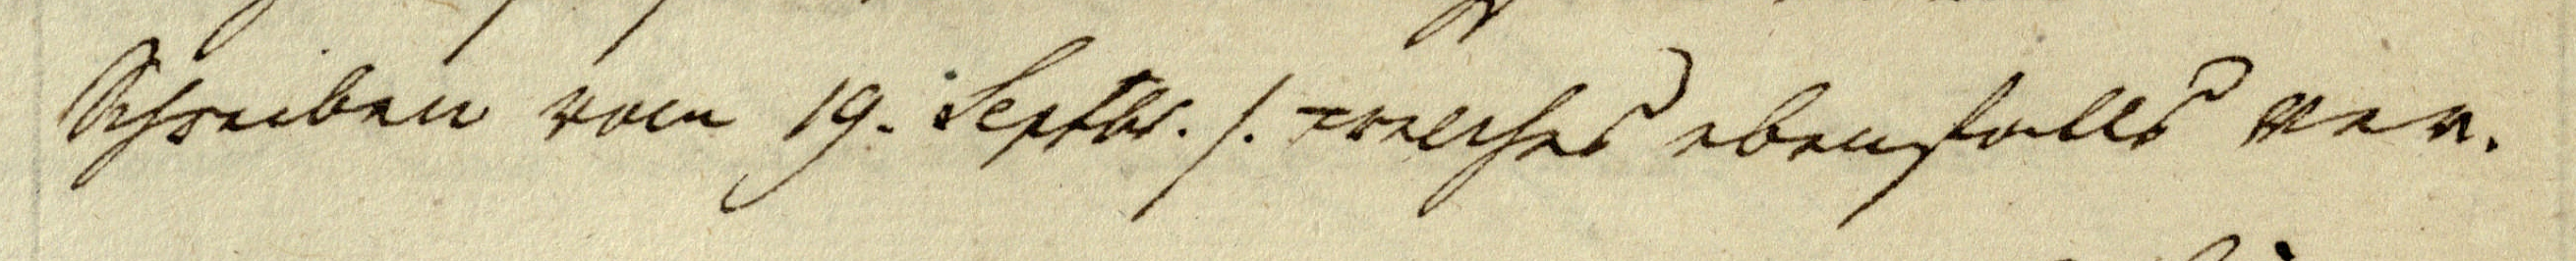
Schreiben vom 19. Septbr. /. welches ebenfalls ver¬
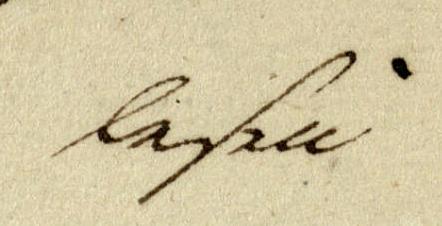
lesen
